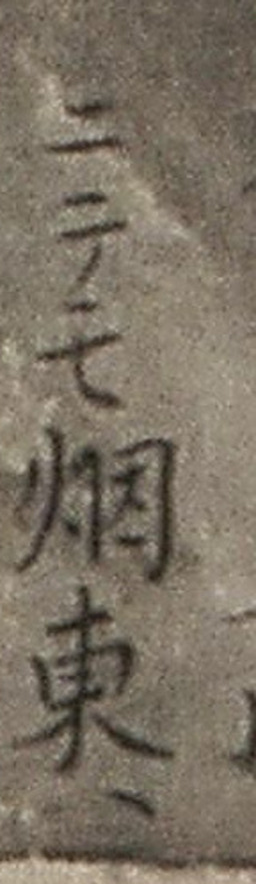二テモ烟東へ
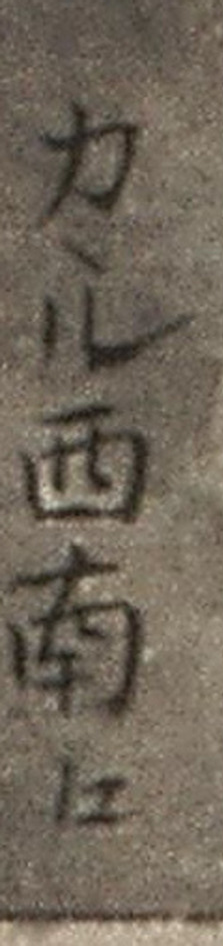カゝル西南え
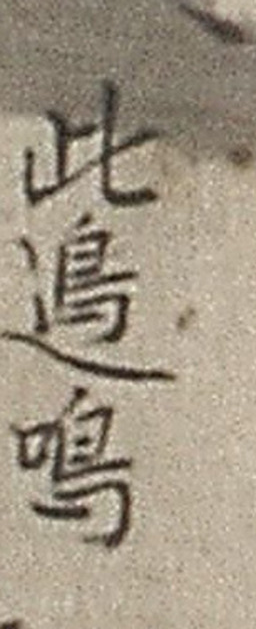此辺鳴
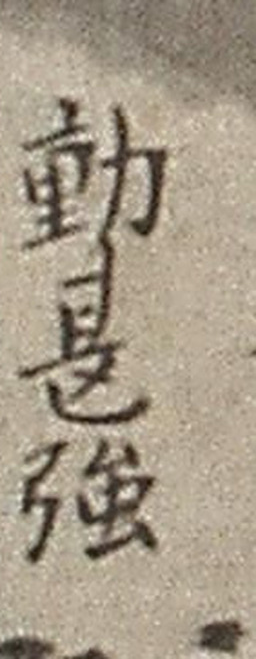動甚強
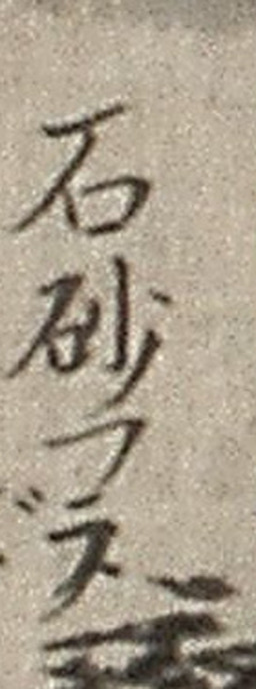石砂フラズ
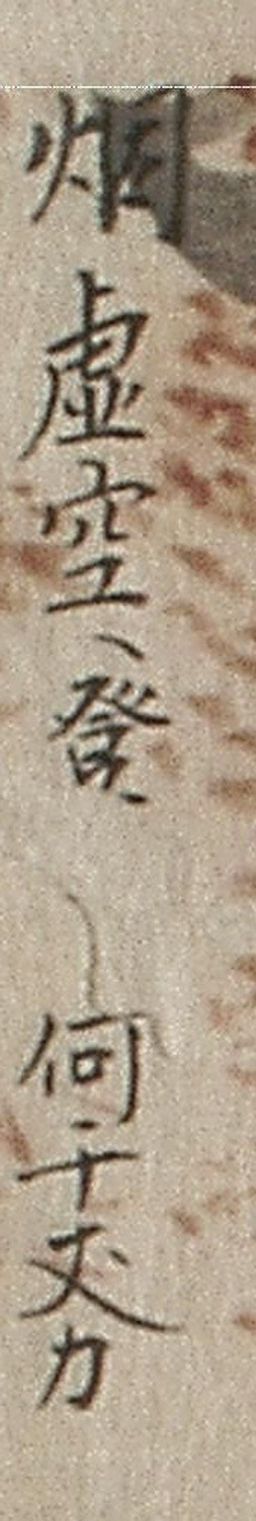烟虚空ヘ発何千丈カ
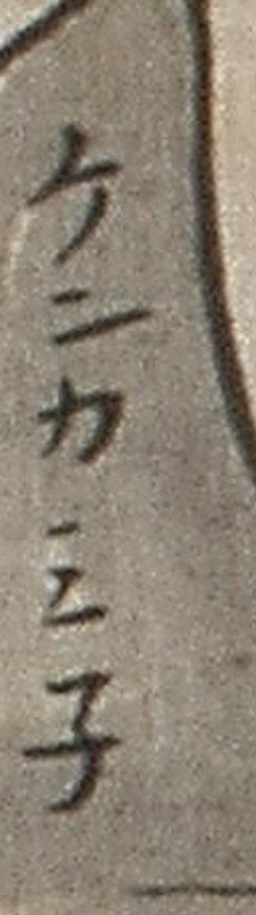ケンカみね
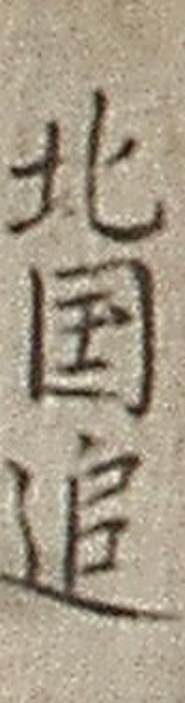北国追
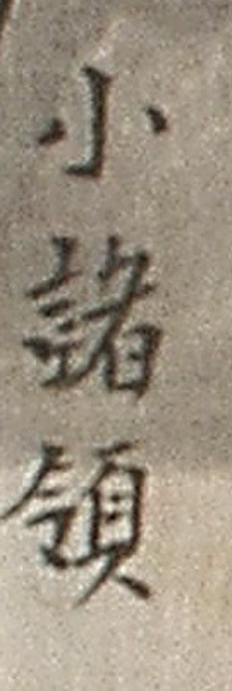小諸領
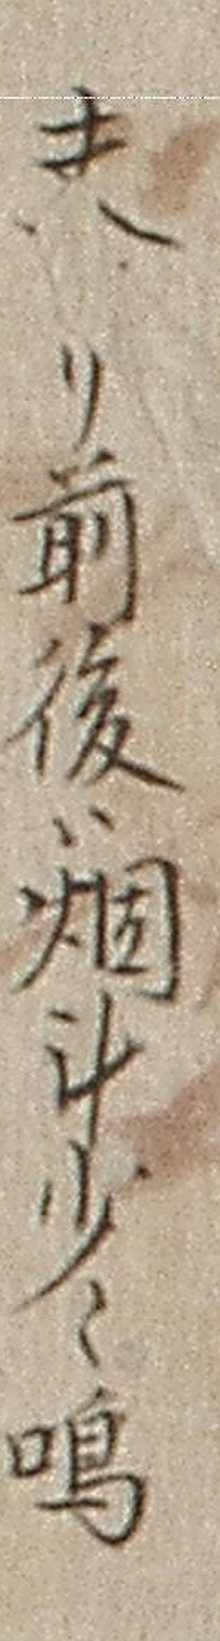夫ヨリ前後ハ烟斗少々鳴
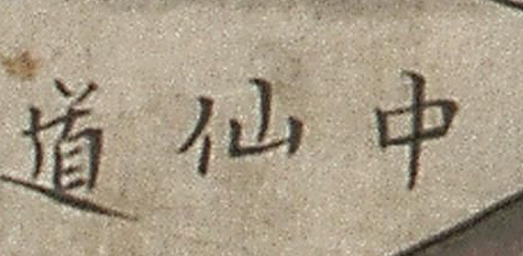中仙道
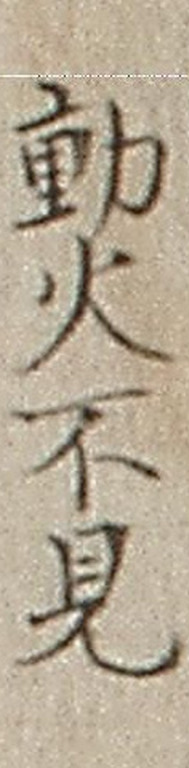動火不見
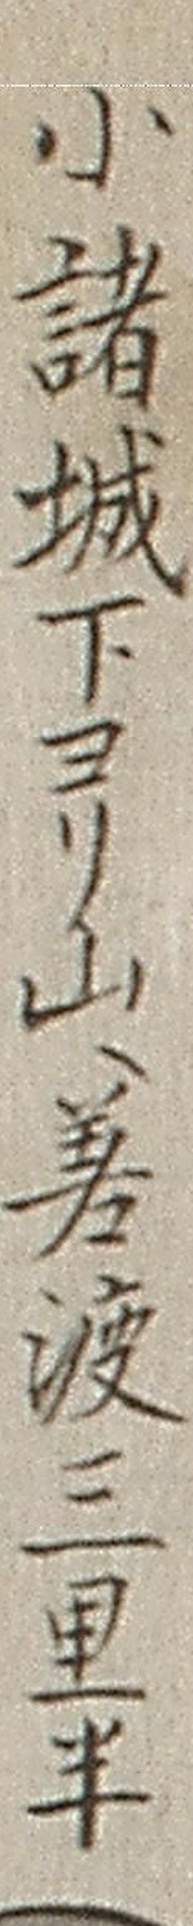小諸城下ヨリ山へ差渡三里半
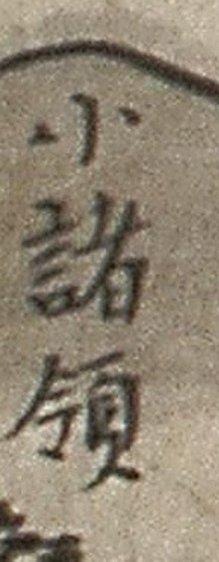小諸領
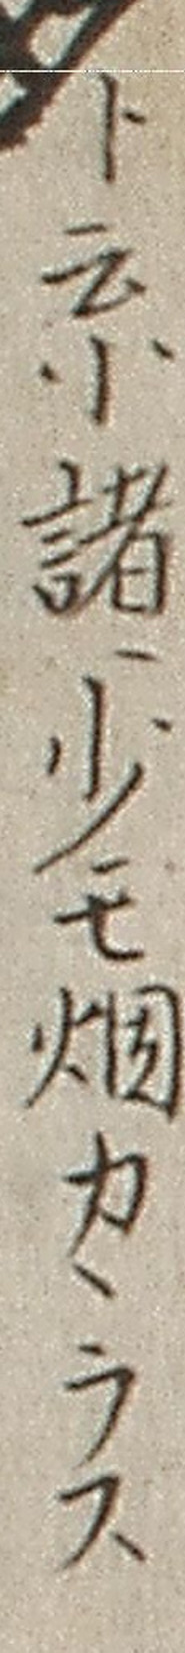ト云小諸へ少モ烟かゝラス

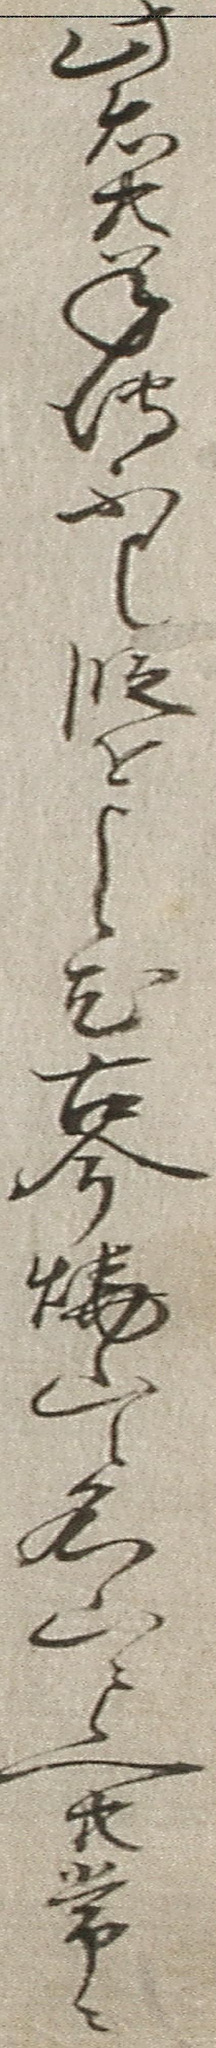此者共承伝不申候段を申候尤古今焼山之名山に候へ共常に
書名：太平秘録抜書　浅間山燒及普賢山崩
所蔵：東京大学地震研究所図書室 Earthquake Research Institute Library, The University of Tokyo, JAPAN
